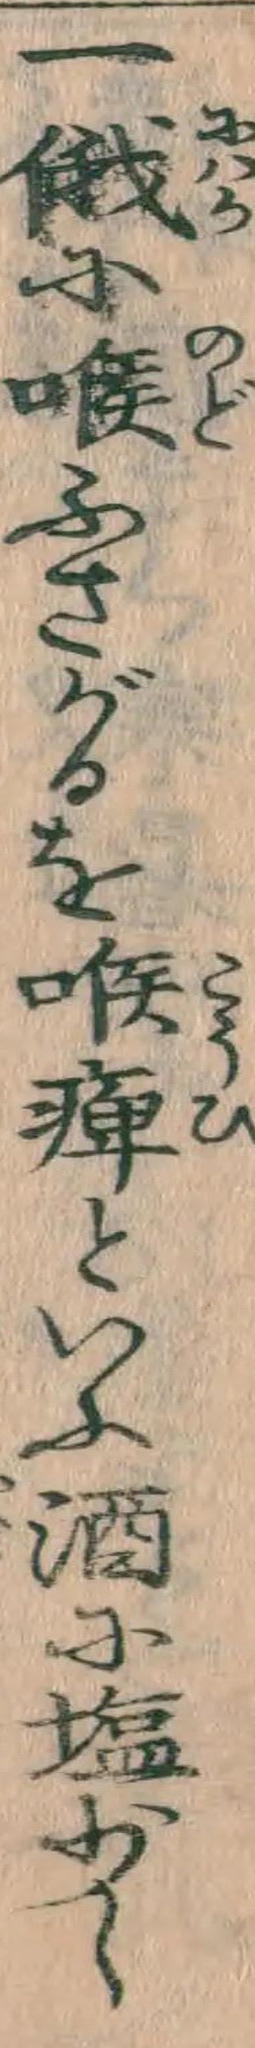一俄に喉ふさがるを喉痺といふ酒に塩少し
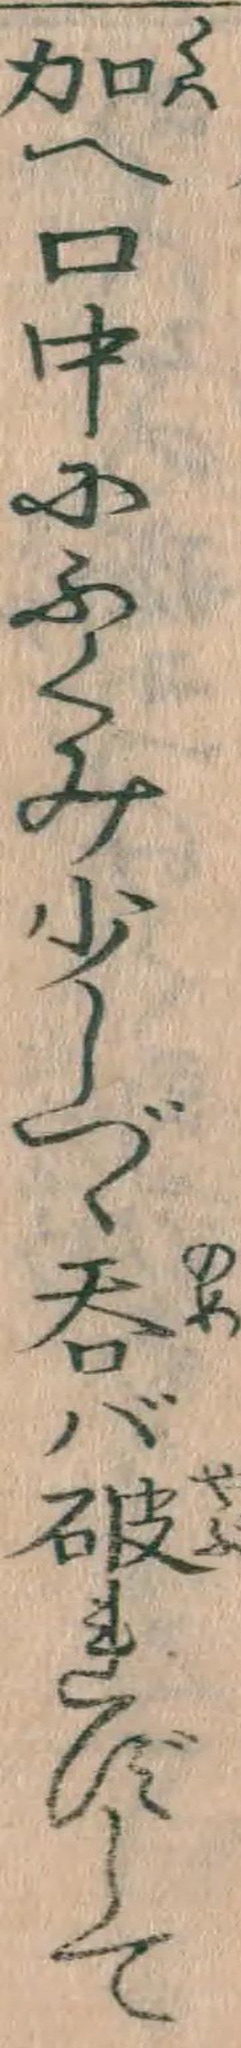加へ口中にふくみ少しづゝ吞ば破れずして
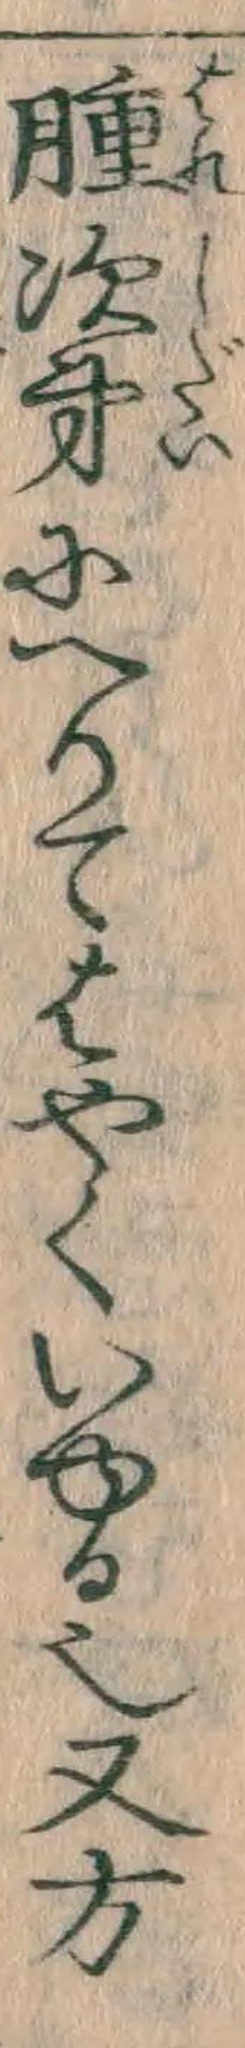腫次第にへりてはやくいゆる也又方
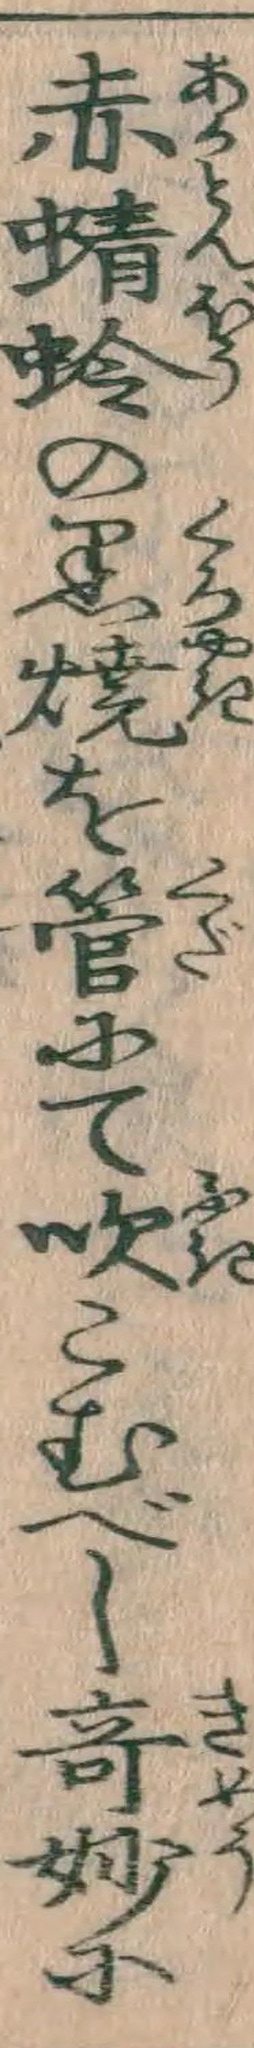赤蜻蛉の黒焼を管にて吹こむべし奇妙に
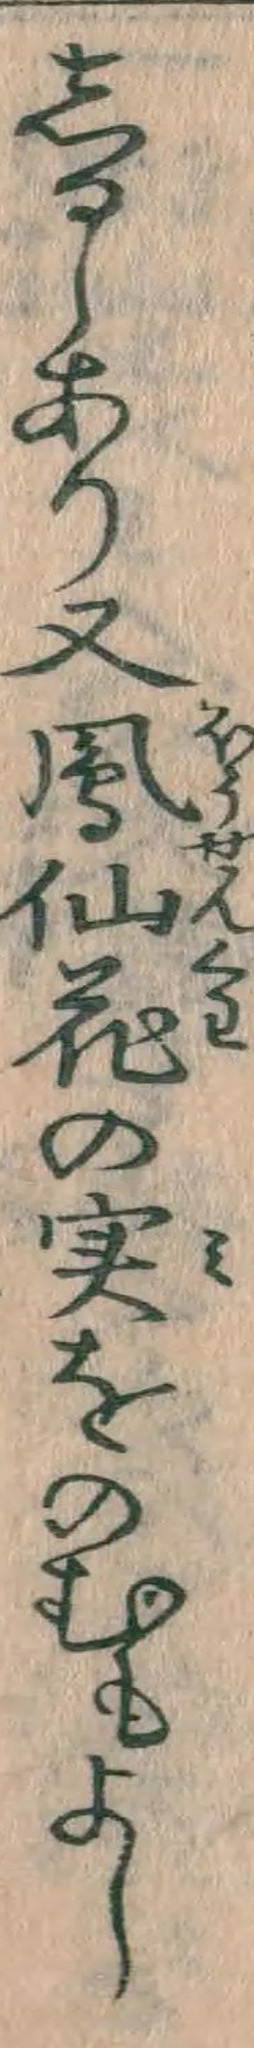しるしあり又鳳仙花の実をのむもよし
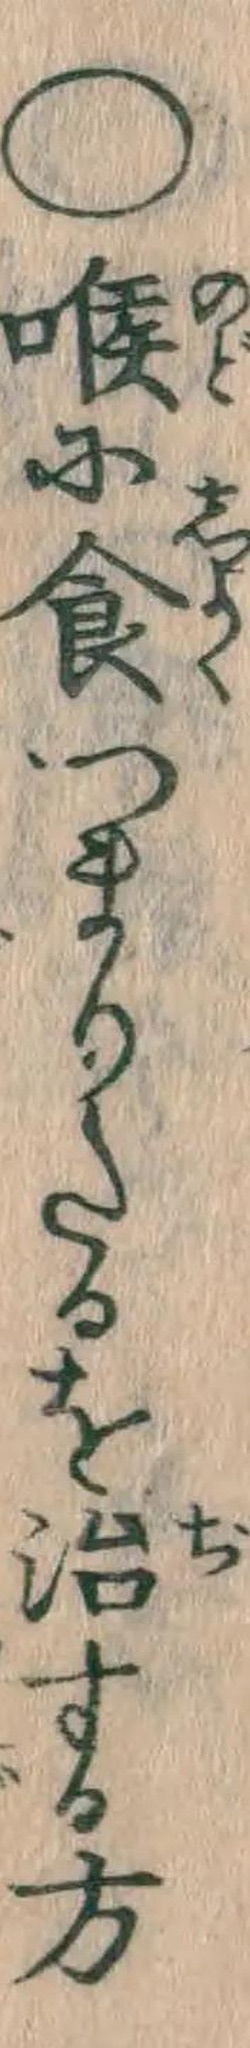○喉に食つまりたるを治する方
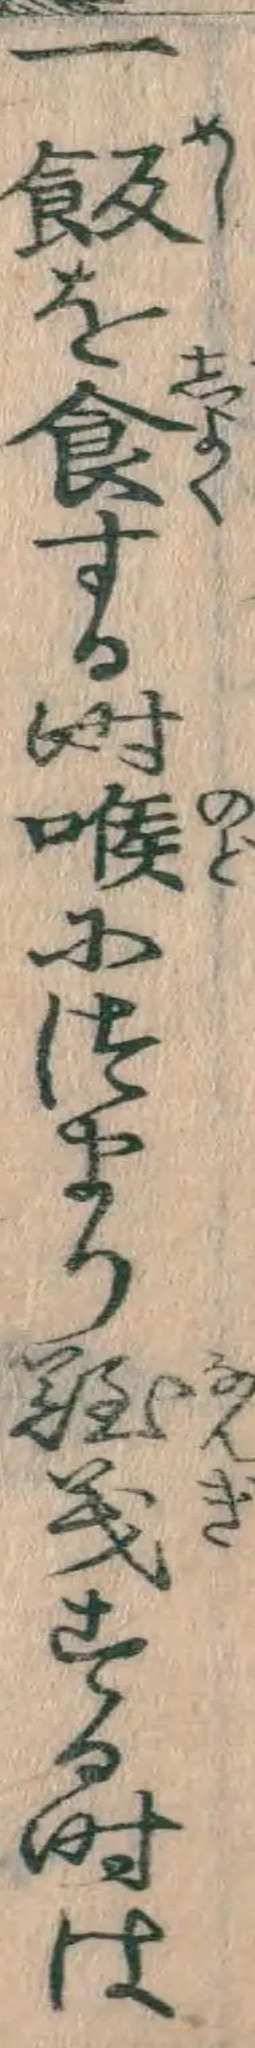一飯を食する時喉につまり難義する時は
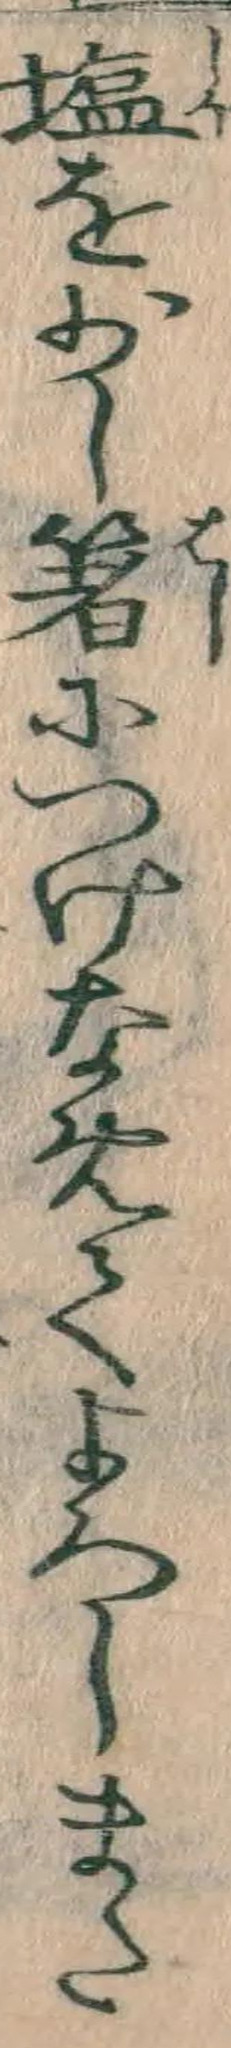塩を少し箸につけなめてよろしまた
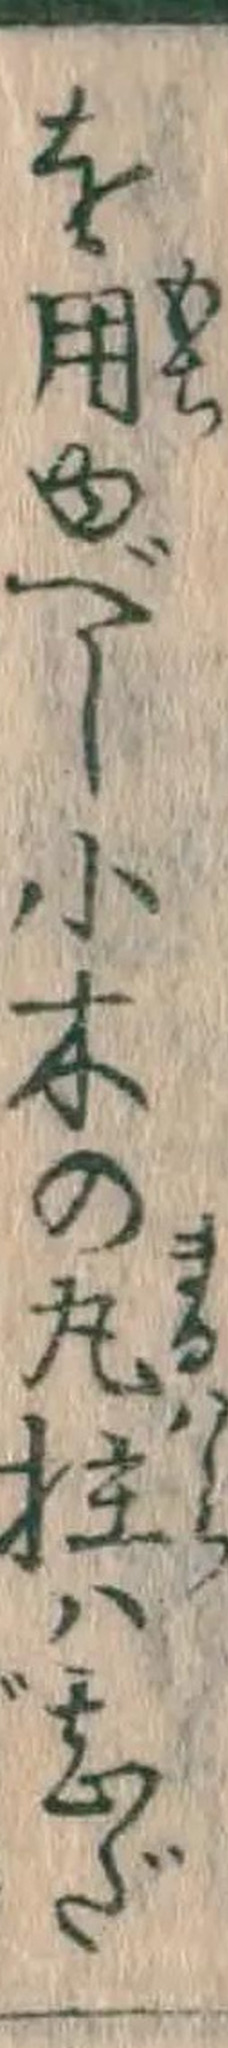を用ゆべし小木の丸柱は甚だ
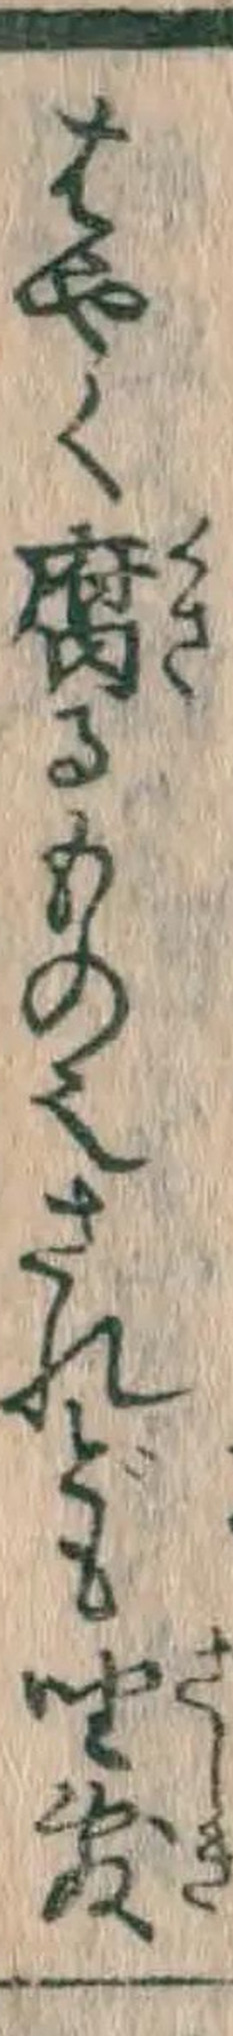はやく腐るもの也されども坐敷
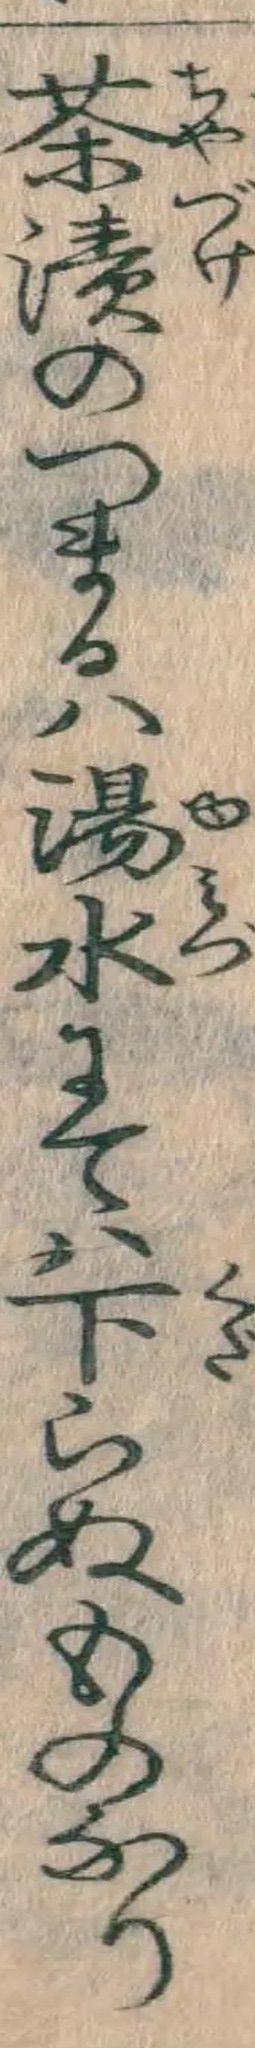茶漬のつまるは湯水にては下らぬものなり
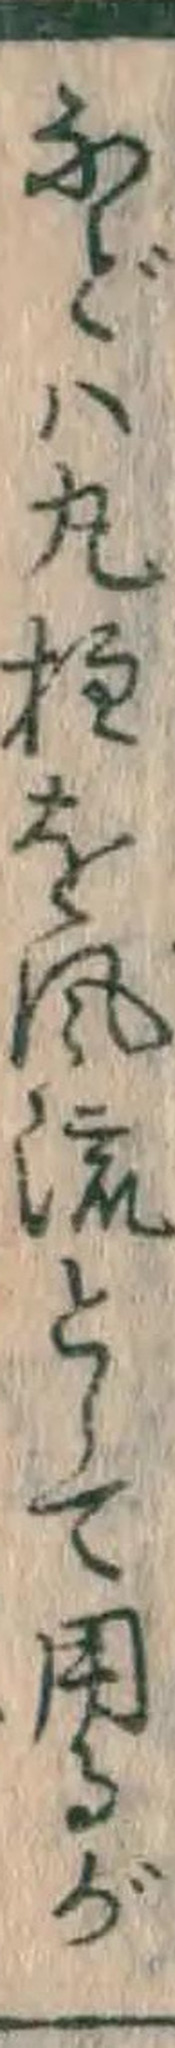などは丸柱を風流として用るが
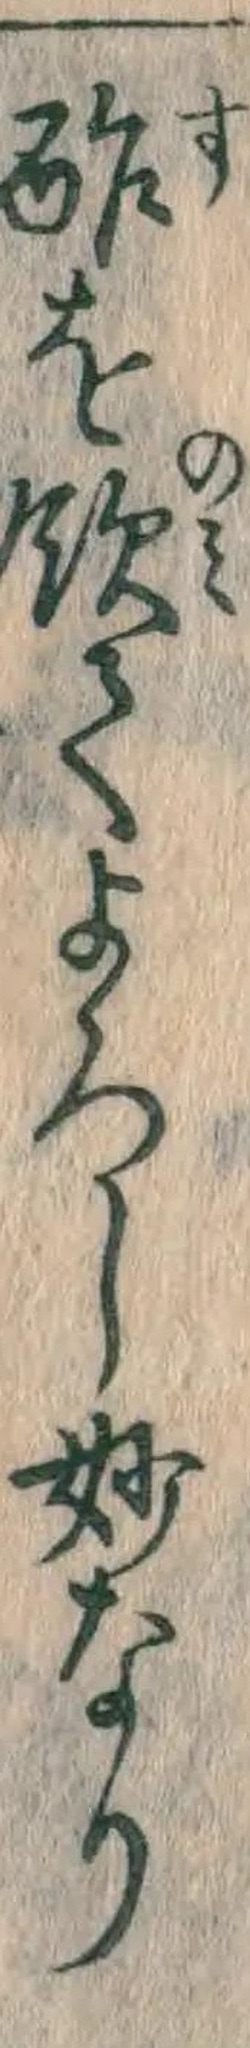酢を飲てよろし妙なり
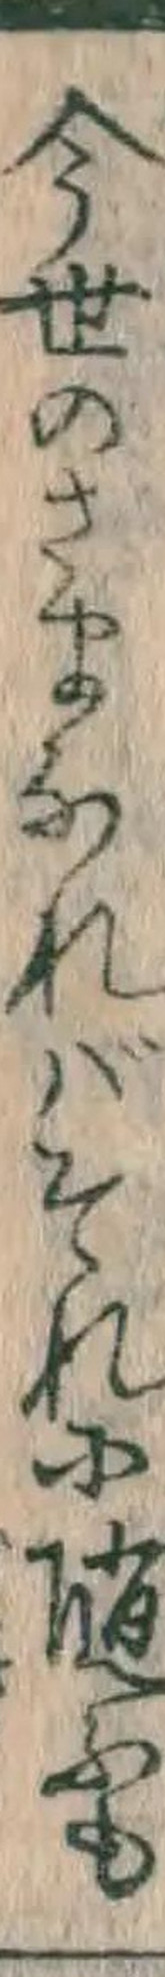今世のさまなればそれに随ふも
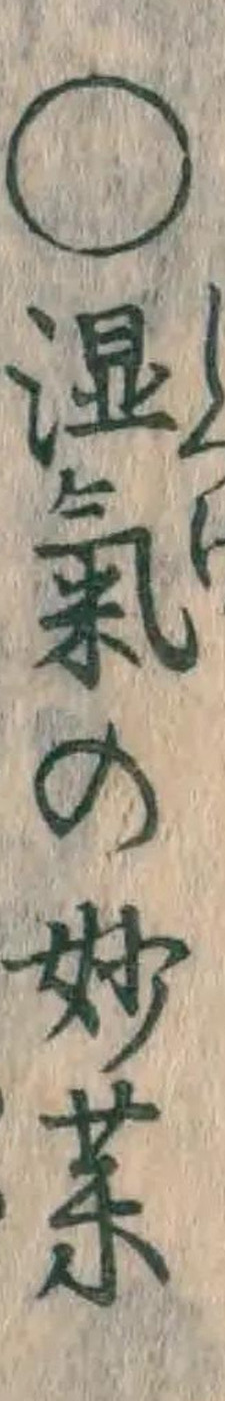○湿気の妙薬
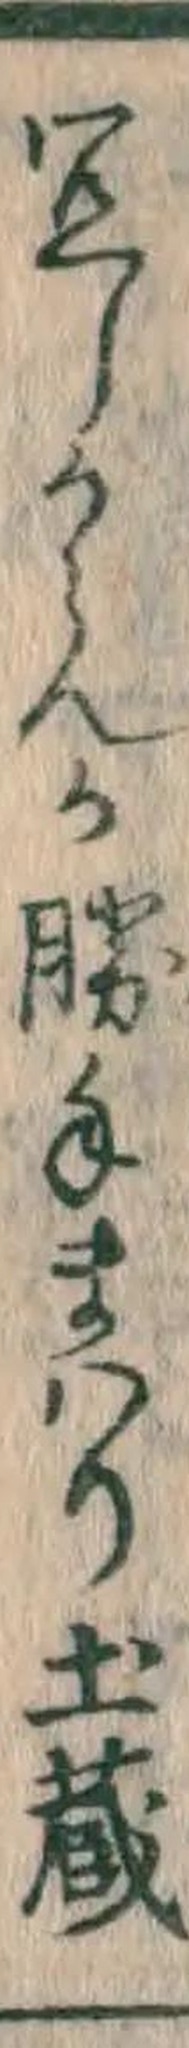宜しからんか勝手まはり土蔵
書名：広益秘事大全 3巻. [3]
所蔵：国立国会図書館 National Diet Library, JAPAN
